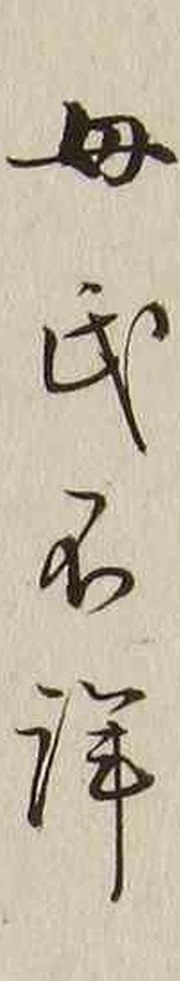母氏不詳
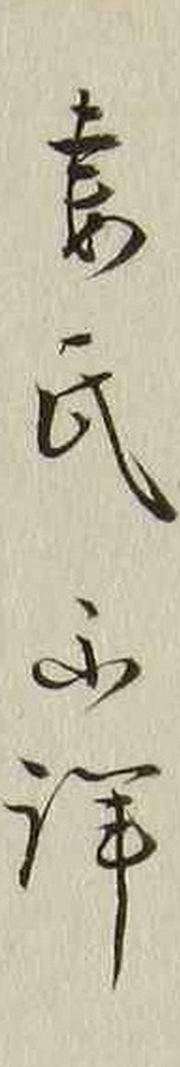妻氏不詳
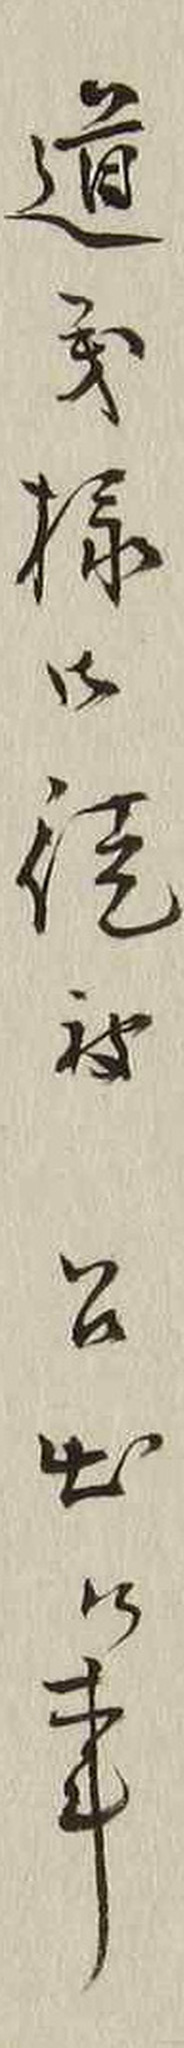道義様御徒被召出候事
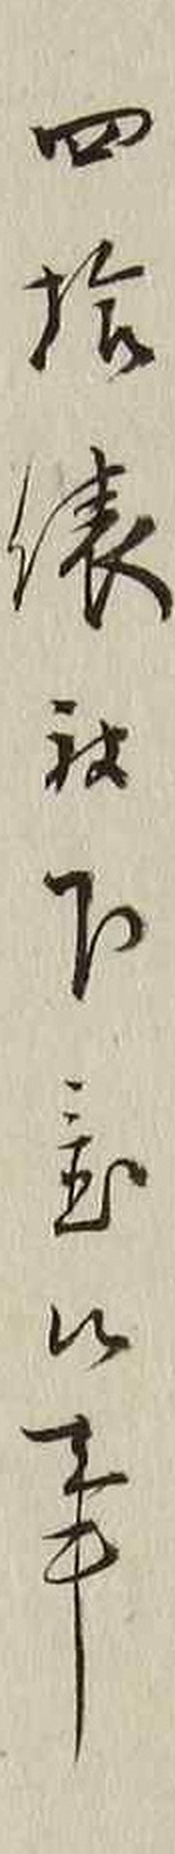四拾俵被下置候事
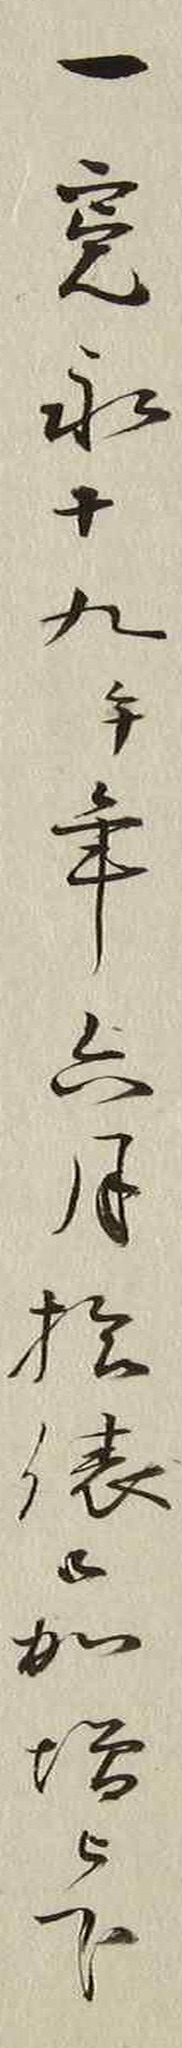一寛永十九午年六月拾俵御加増被下
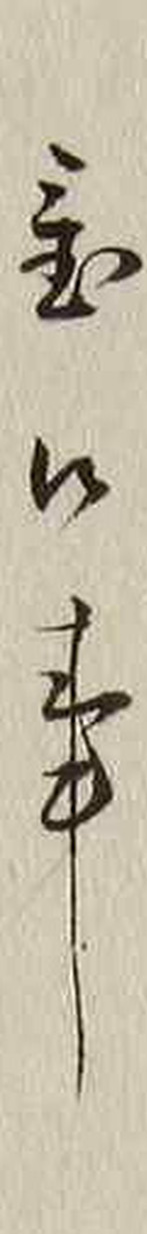置候事
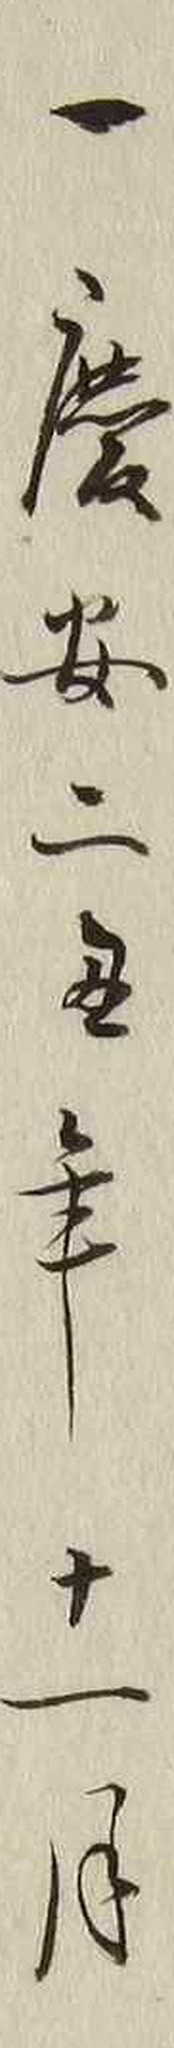一慶安二丑年十一月
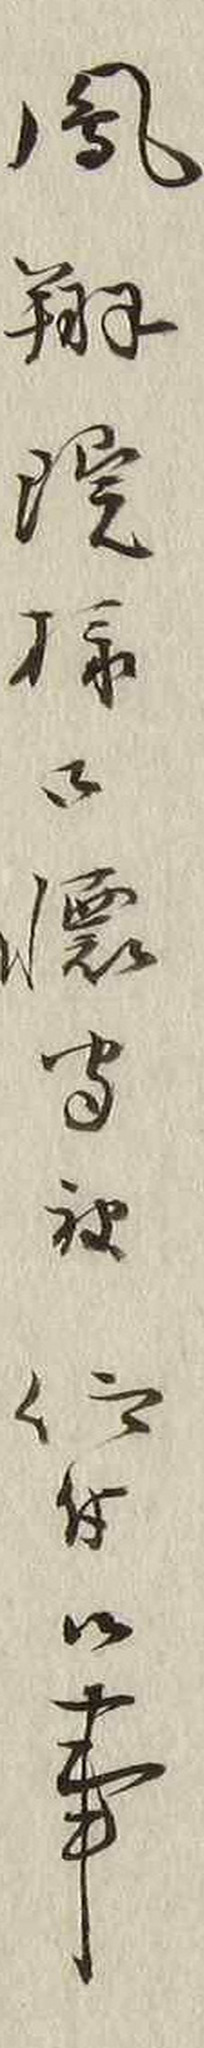鳳翔院様御懐守被仰付候事
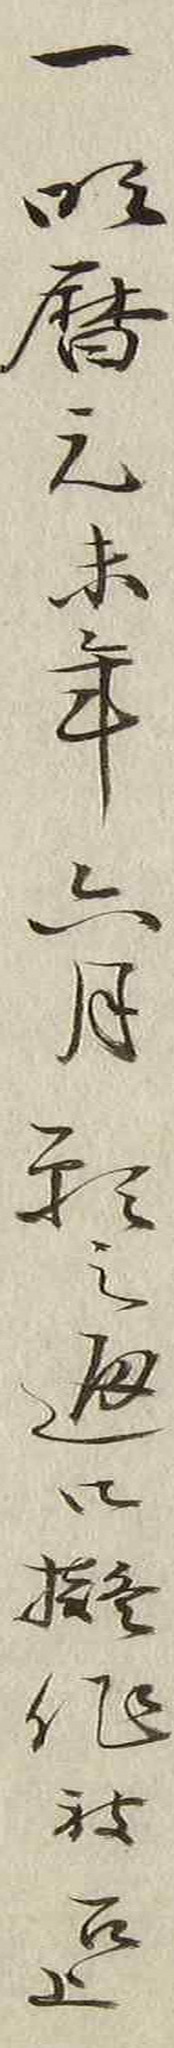一明暦元未年六月願之通御擬作被召上
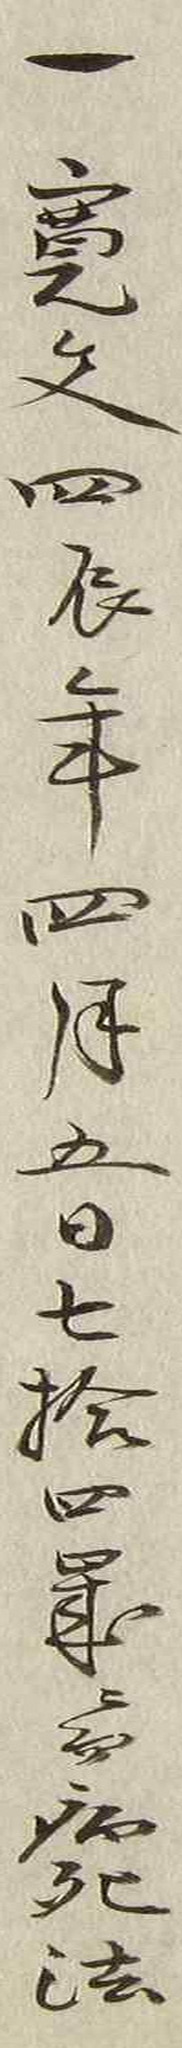一寛文四辰年四月五日七拾四歳に而病死法
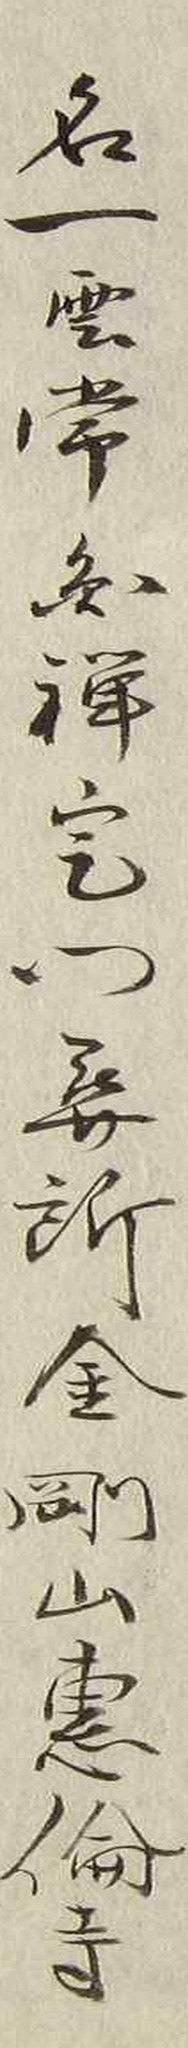名一雲常円禅定門葬所金剛山恵倫寺
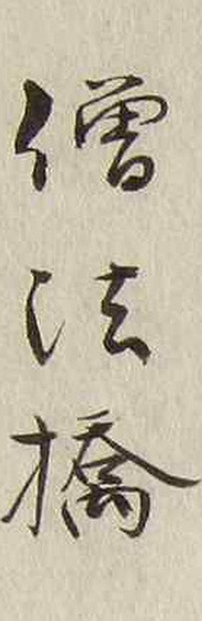僧法橋

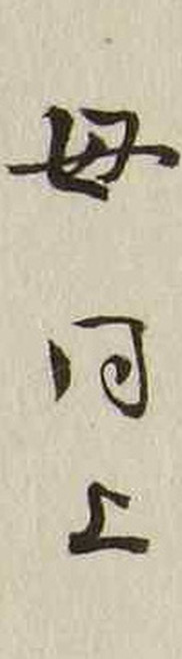母同上
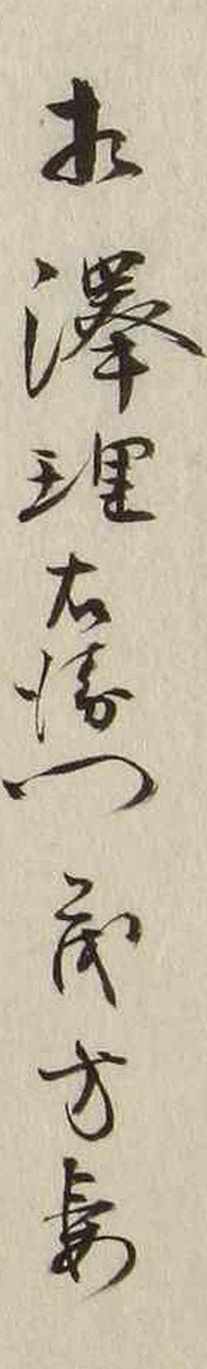女相沢理右衛門茂方妻
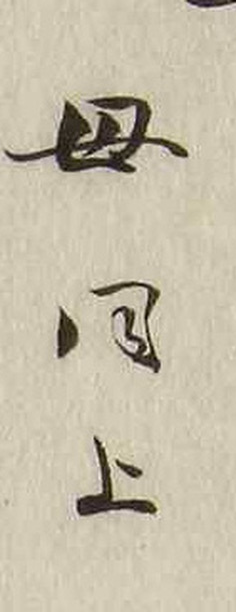母同上
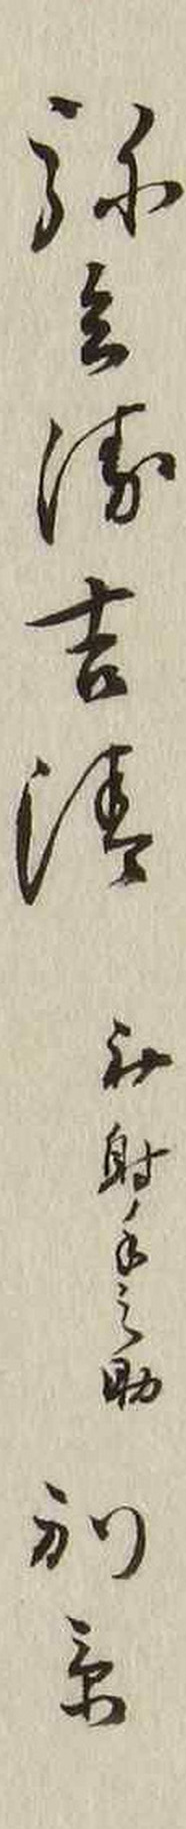弥兵衛吉清初射手之助別系
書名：諸士系譜　巻之157　ね之部1
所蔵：会津若松市立会津図書館
